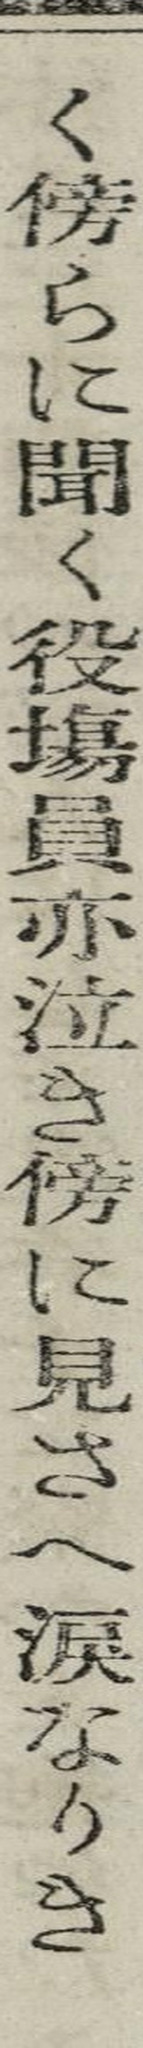く傍らに聞く役場員亦泣き傍に見さへ涙なりき
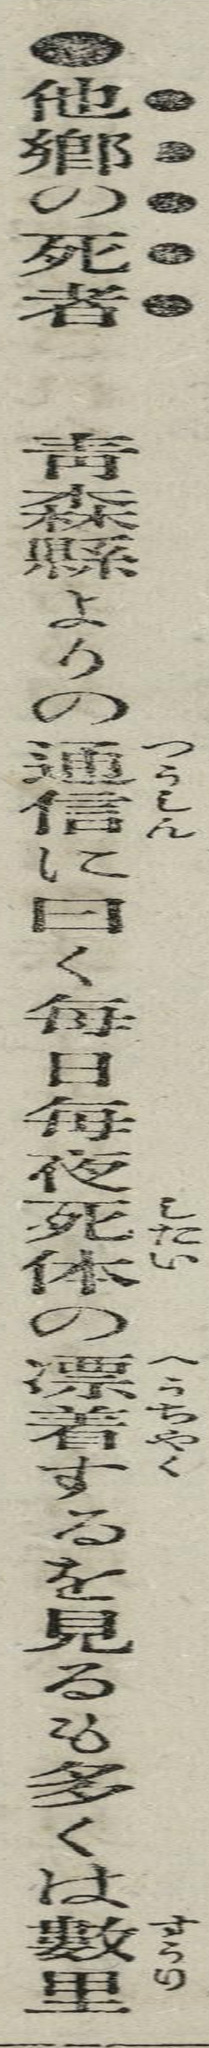●他郷の死者青森県よりの通信に曰く毎日毎夜死体の漂着するを見るも多くは数里
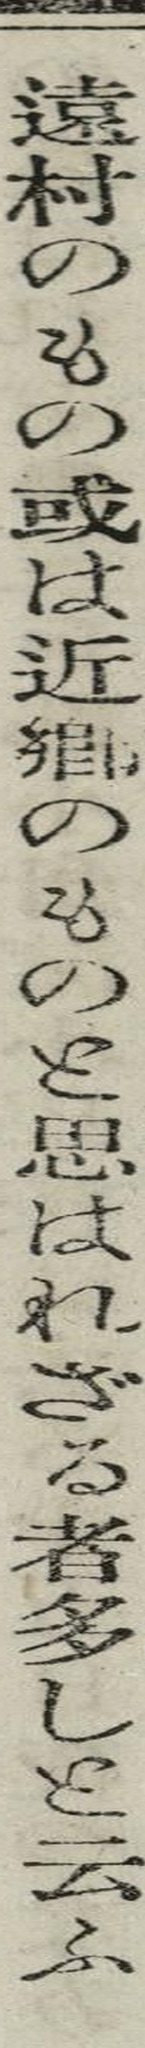遠村のもの或は近郷のものと思はれざる者多しと云ふ
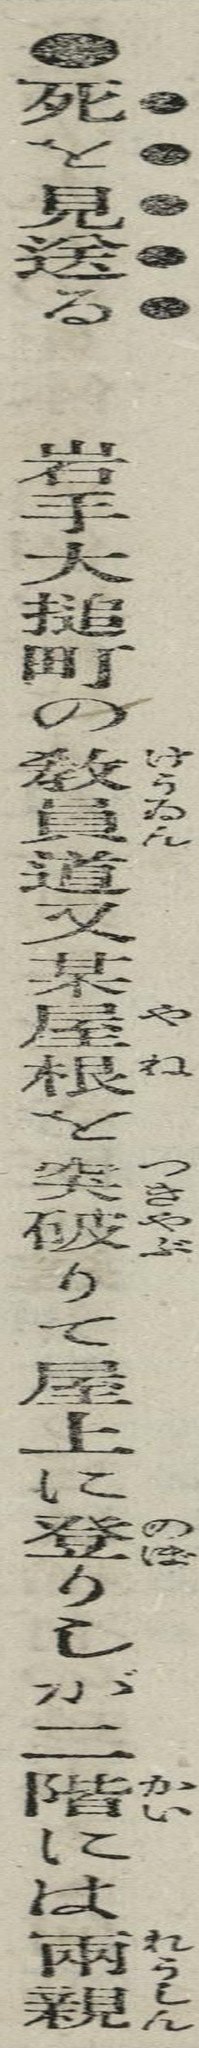●死を見送る岩手大槌町の教員道又某屋根を突破りて屋上に登りしが二階には両親
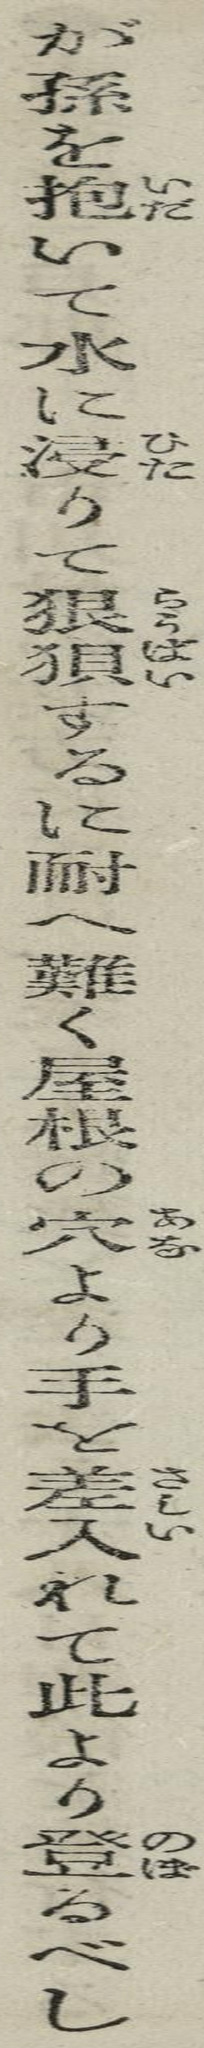が孫を抱いて水に浸りて狼狽するに耐へ難く屋根の穴より手を差入れて此より登るべし
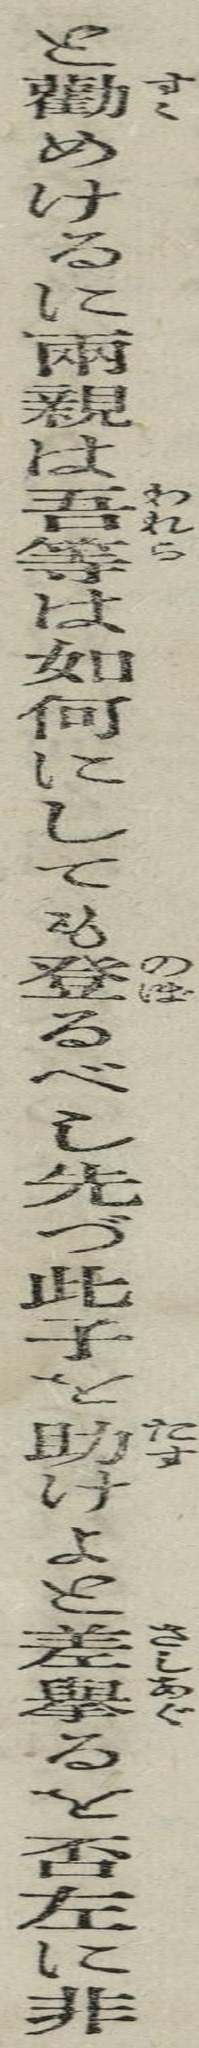と勧めけるに両親は吾等は如何にしても登るべし先づ此子を助けよと差挙ると否左に非
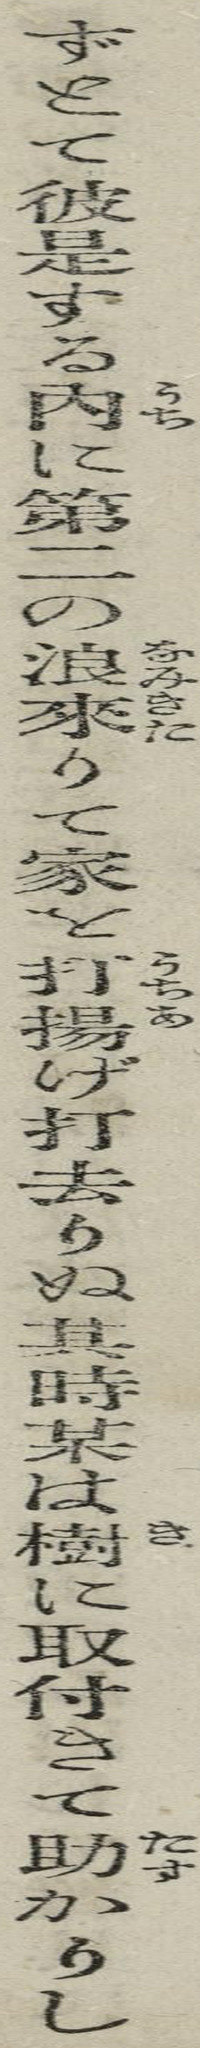ずとて彼是する内に第二の浪来りて家を打揚げ打去りぬ其時某は樹に取付きて助かりし
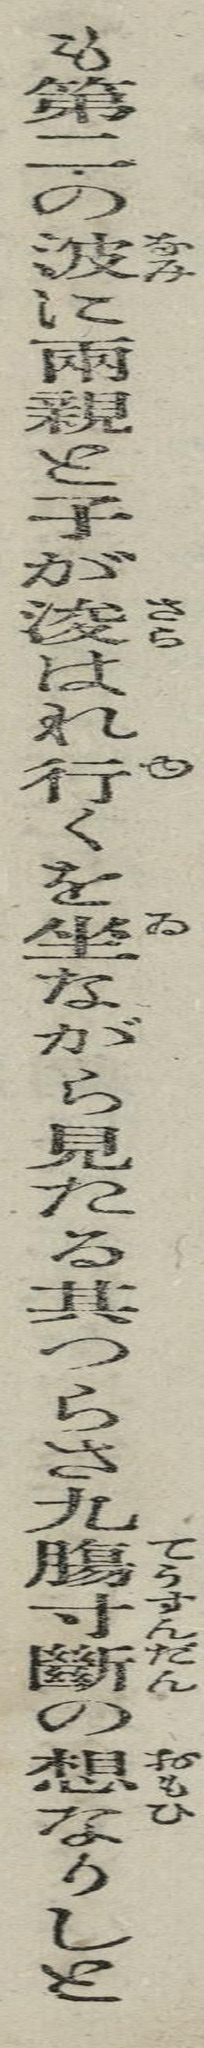も第二の波に両親と子が浚はれ行くを坐ながら見たる其つらさ九腸寸断の想なりしと

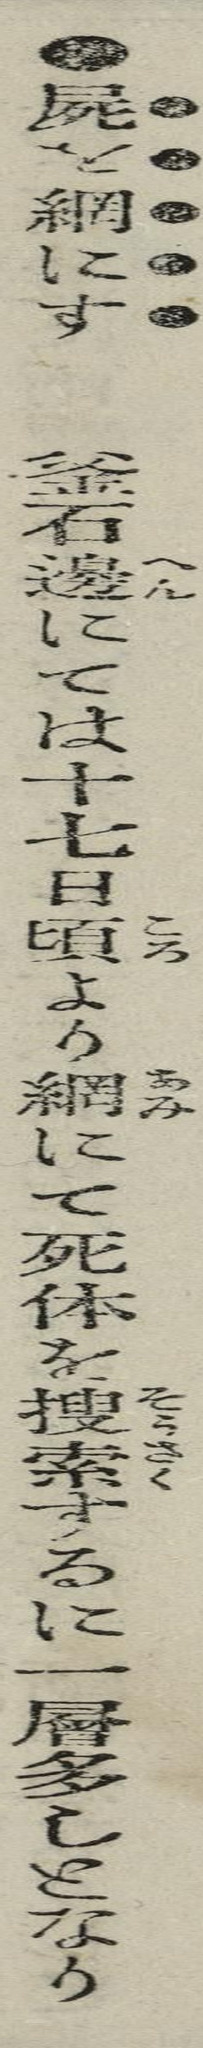●屍を網にす釜石邊にては十七日頃より網にて死体を捜索するに一層多しとなり
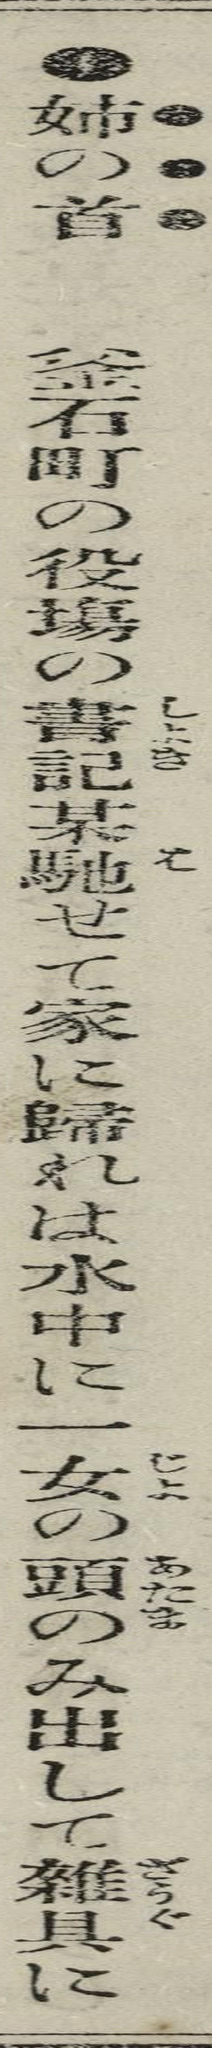●姉の首釜石町の役場の書記某馳せて家に帰れは水中に一女の頭のみ出して雑具に
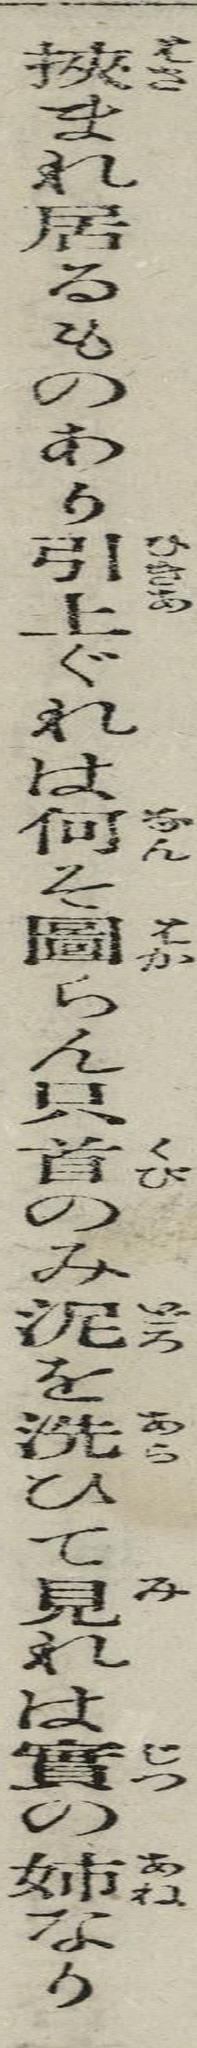挟まれ居るものあり引上ぐれは何そ図らん只首のみ泥を洗ひて見れは実の姉なり
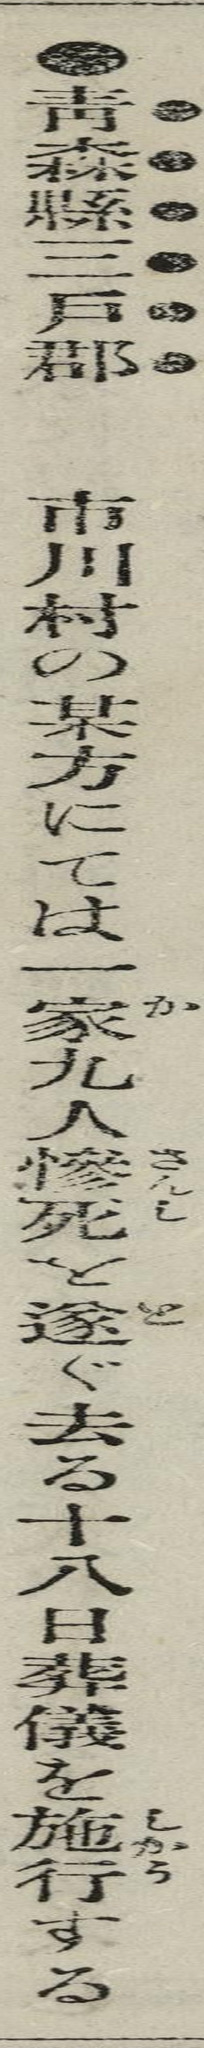●青森県三戸郡市川村の某方にては一家九人惨死を遂ぐ去る十八日葬儀を施行する
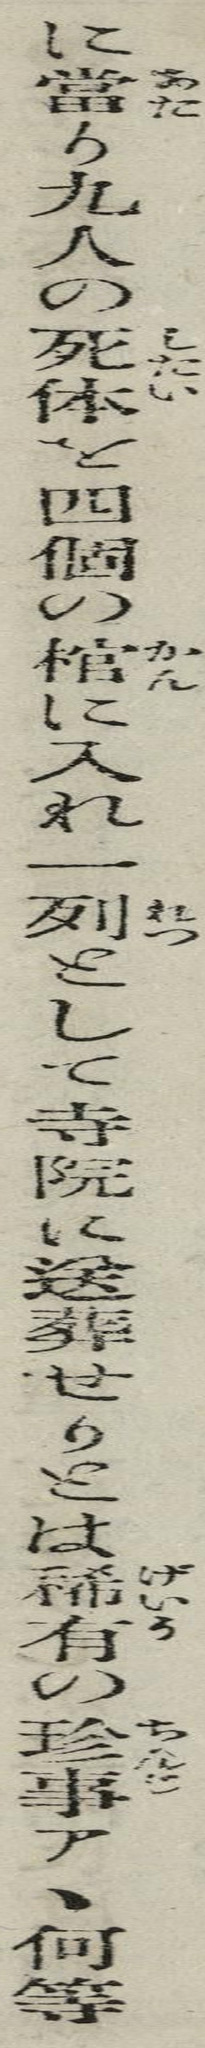に当たり九人の死体を四個の棺に入れ一列として寺院に送葬せりとは稀有の珍事アヽ何等
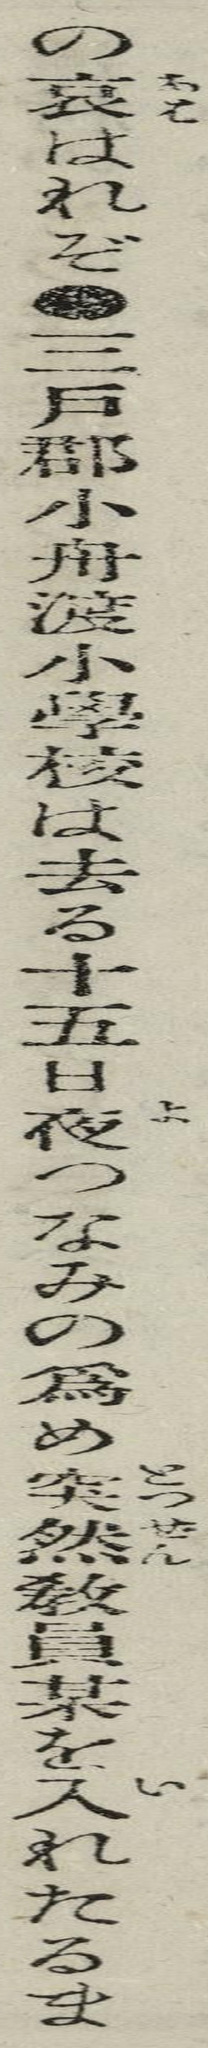の哀はれぞ●三戸郡小舟渡小学校は去る十五日夜つなみの為め突然教員某を入れたるま
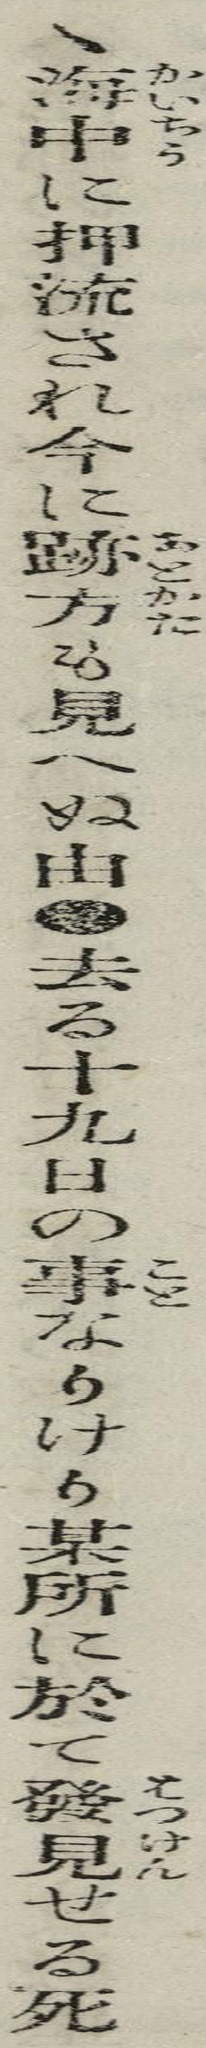ゝ海中に押流され今に跡方もみへぬ由●去る十九日の事なりけり某所に於て発見せる死
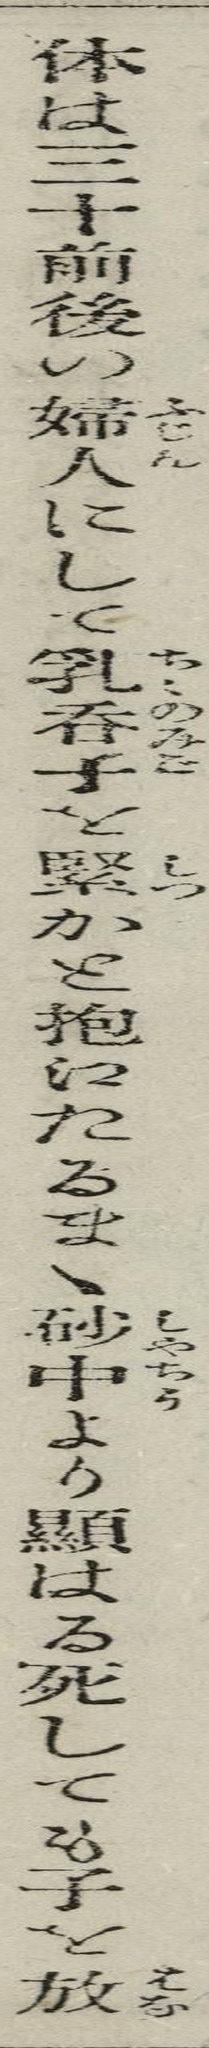体は三十前後の婦人にして乳呑子を緊かと抱えたるま砂中より顕はる死しても子を放
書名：三陸海嘯細見
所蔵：東京大学地震研究所図書室 Earthquake Research Institute Library, The University of Tokyo, JAPAN
